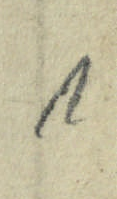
1
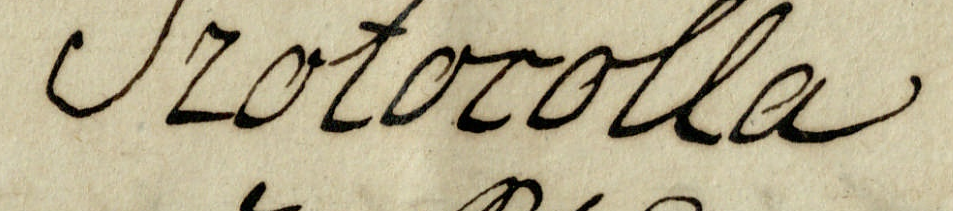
Protocolla
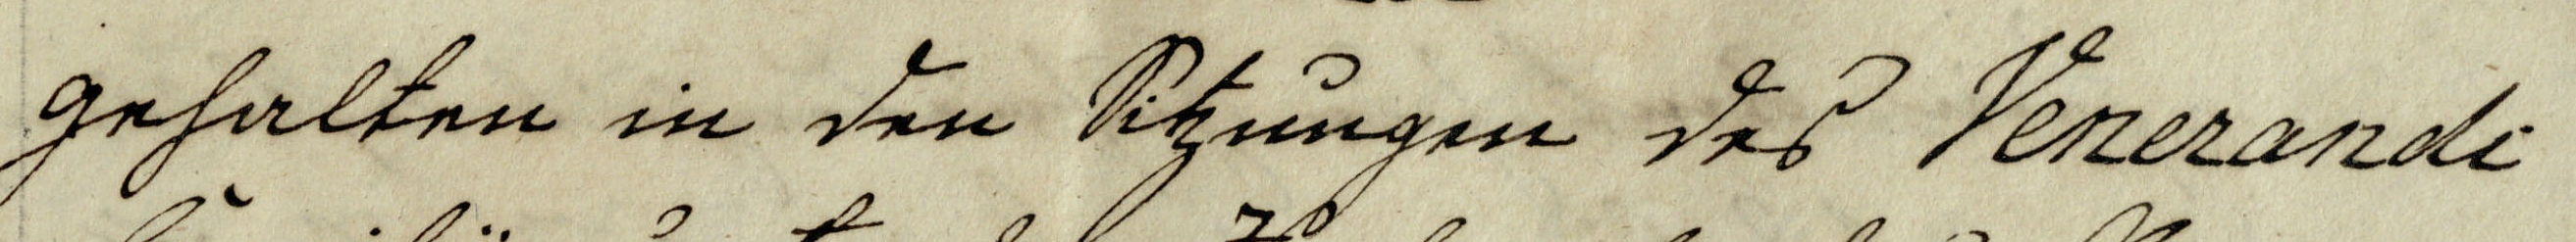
gehalten in den Sitzungen des Venerandi
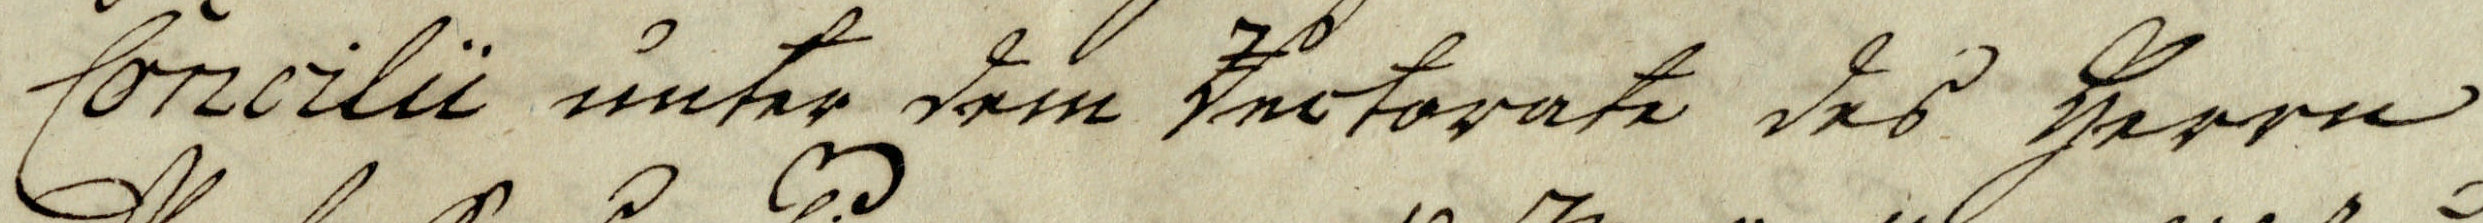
Concilii unter dem Rectorate des Herrn
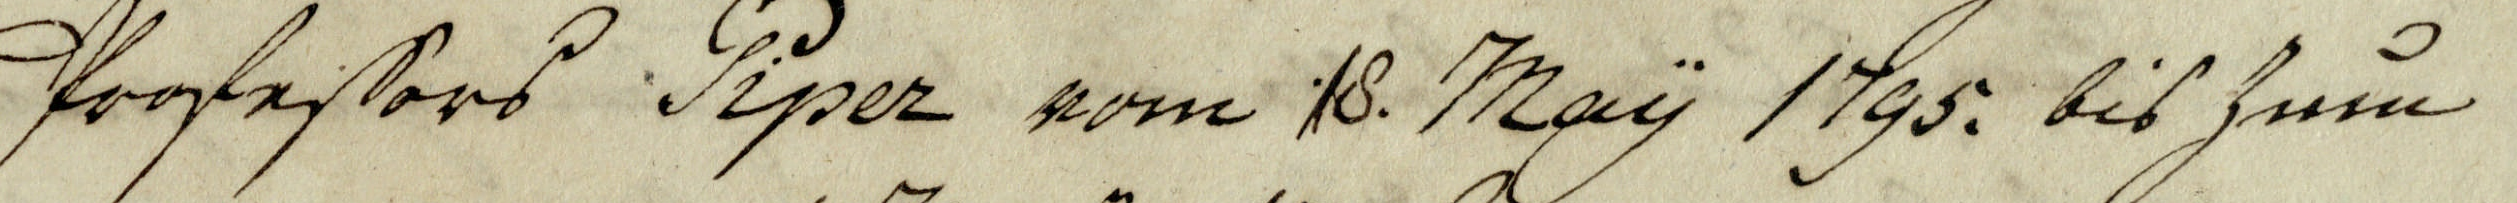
Professors Piper vom 18. Maÿ 1795. bis zum
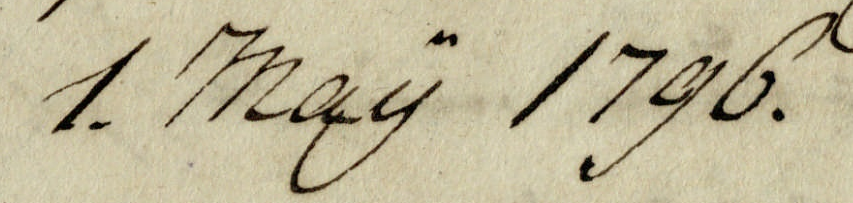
1. Maÿ 1796.
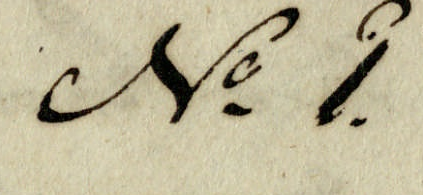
No 1.
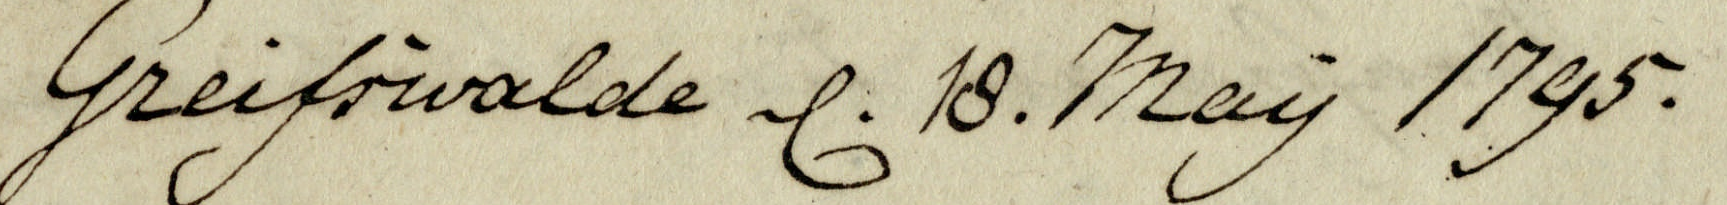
Greifswalde d. 18. Maÿ 1795.
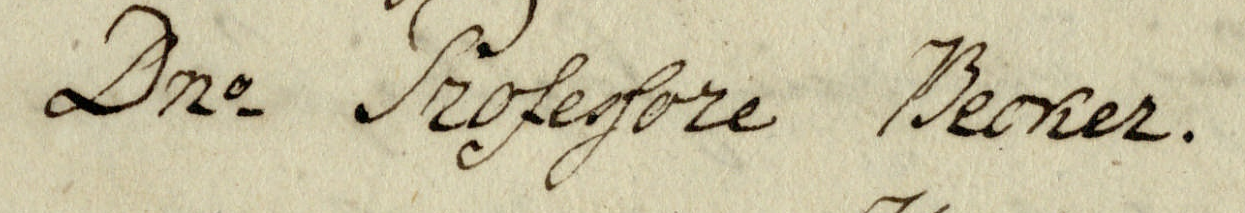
Dno Professore Becker.
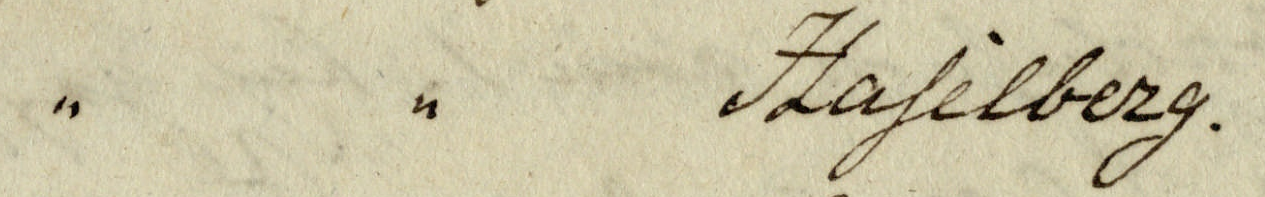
" " Haselberg.
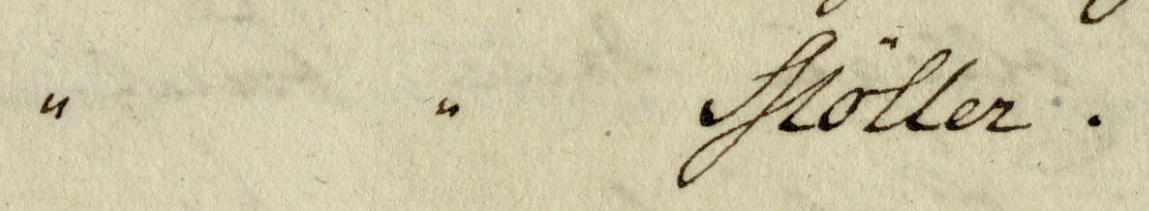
" " Möller.
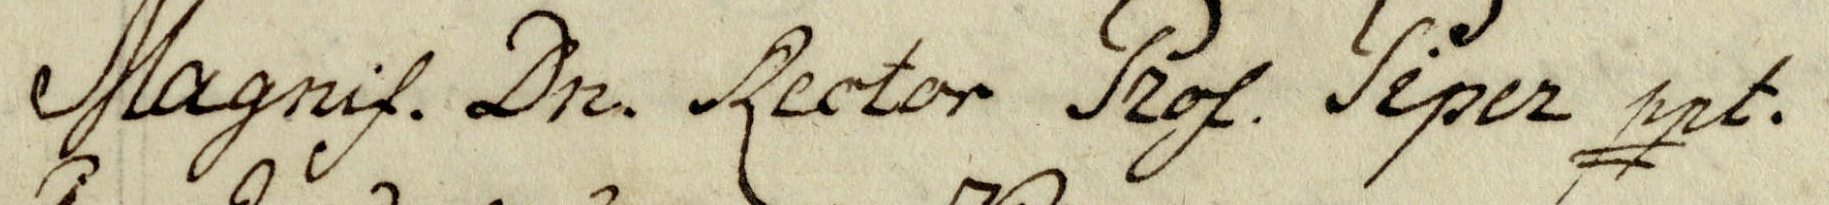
Magnif. Dn. Rector Prof. Piper ppt.
